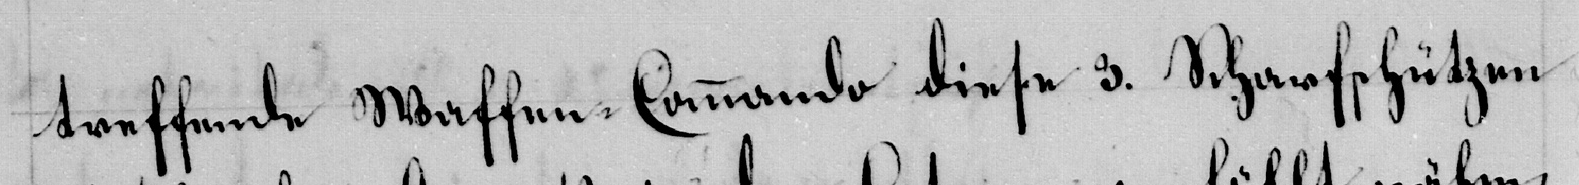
treffende Waffen-Commando diese 3. Scharfschützen
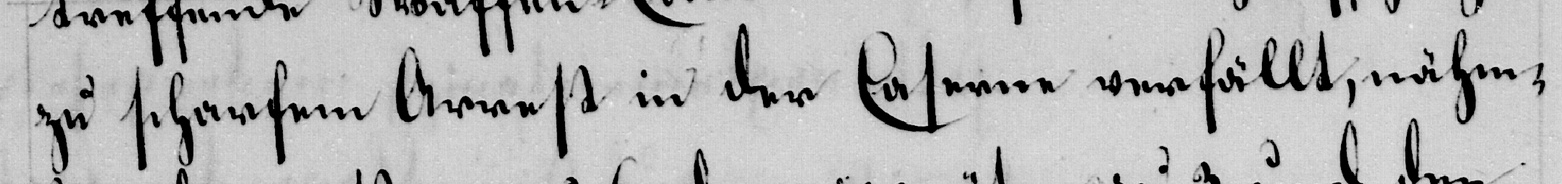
zu scharfem Arrest in der Caserne verfällt, nähm¬
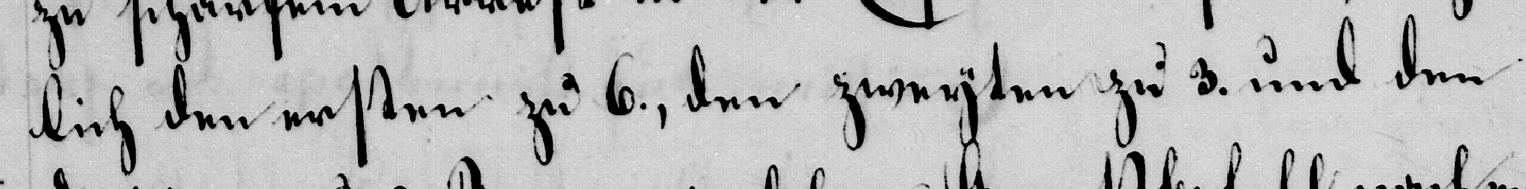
lich den ersten zu 6., den zweyten zu 3. und den
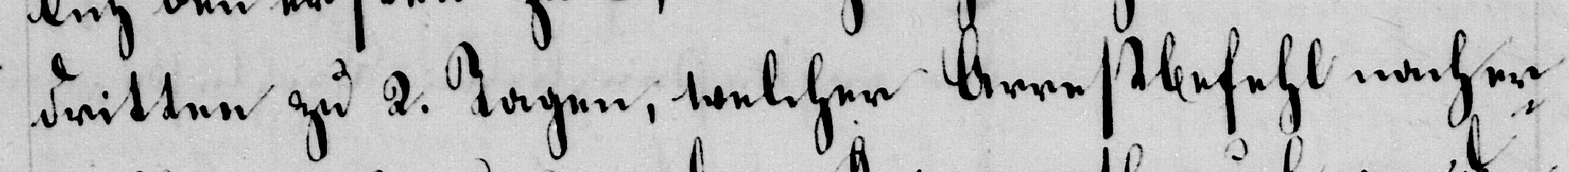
dritten zu 2. Tagen, welcher Arrestbefehl nach er¬
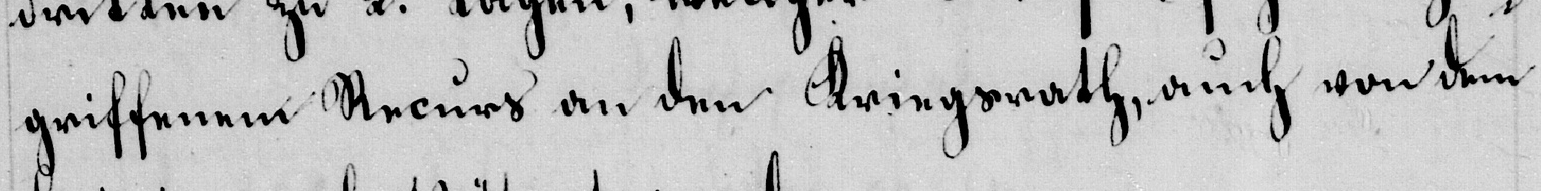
griffenem Recurs an den Kriegsrath, auch von dem
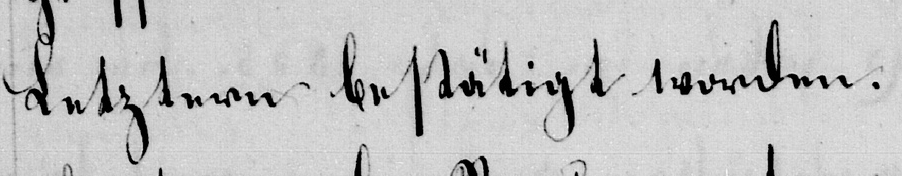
Letztern bestätigt worden.
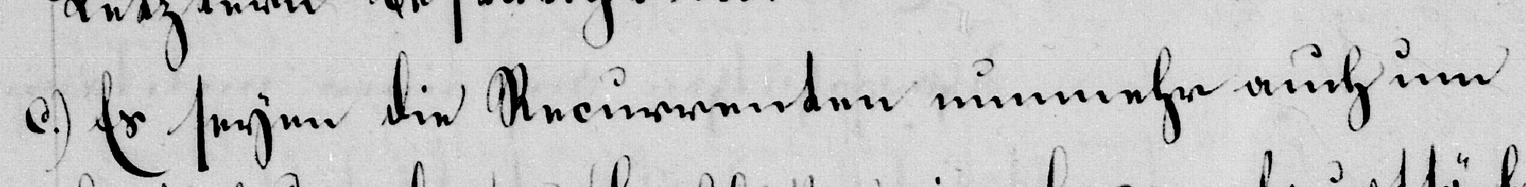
c.) Es seyen die Recurrenten nunmehr auch um
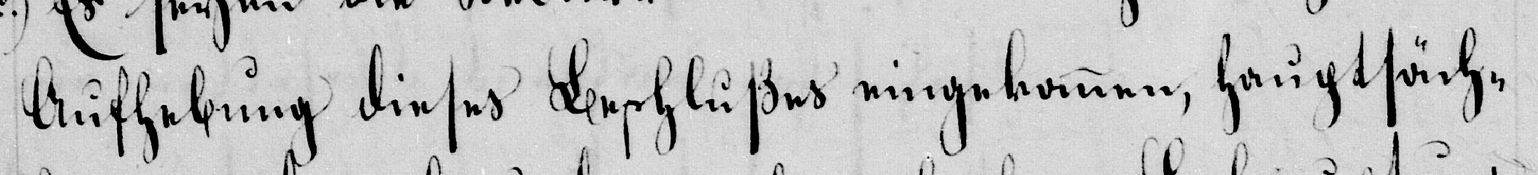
Aufhebung dieses Beschlußes eingekommen, hauptsäch¬
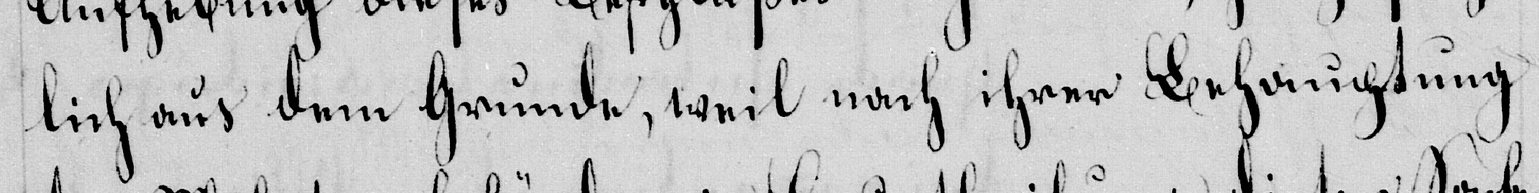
lich aus dem Grunde, weil nach ihrer Behauptung
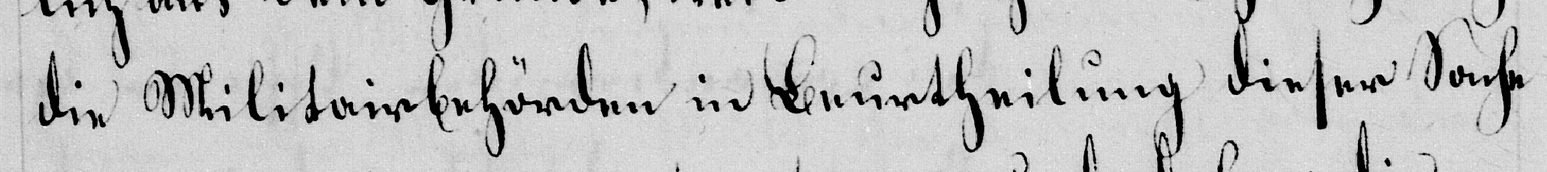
die Militairbehörden in Beurtheilung dieser Sache
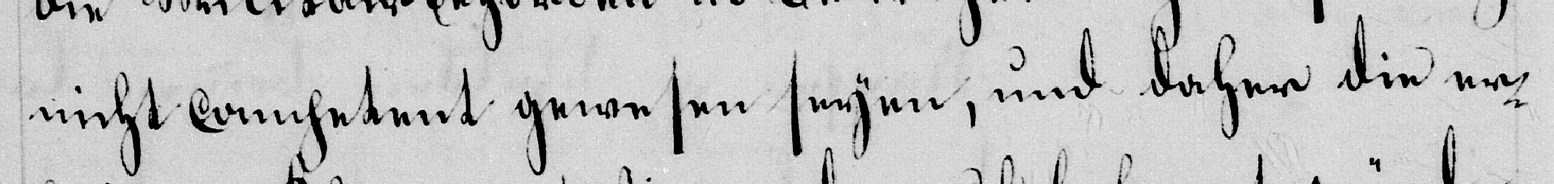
nicht competent gewesen seyen, und daher die er¬
